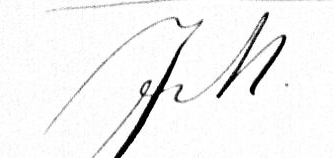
Jh.
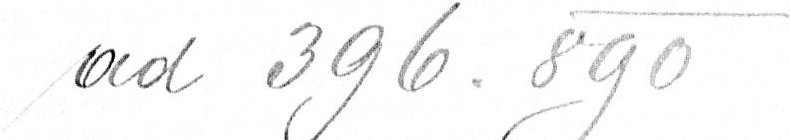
ad 396.890
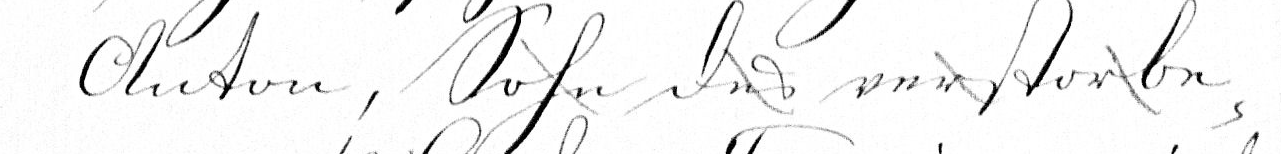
Anton, Sohn des verstorbe¬
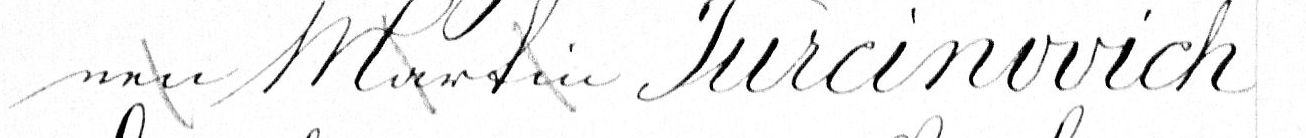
nen Martin Turcinovich
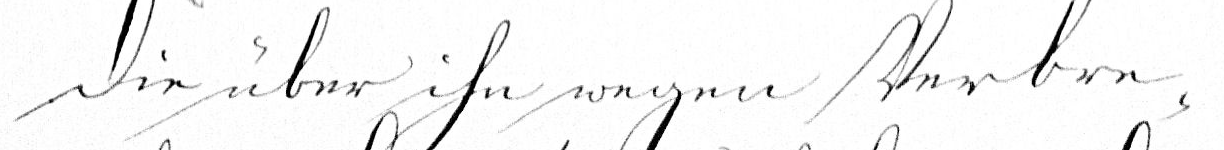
Die über ihn wegen Verbre¬
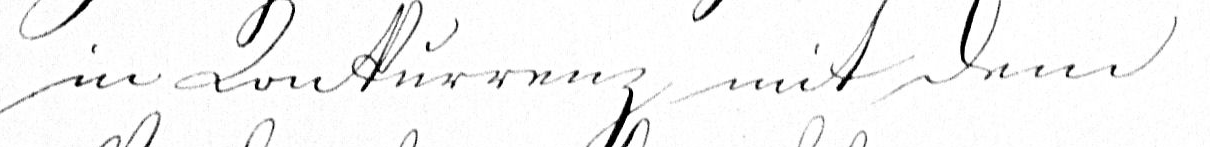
in Konkurrenz mit dem
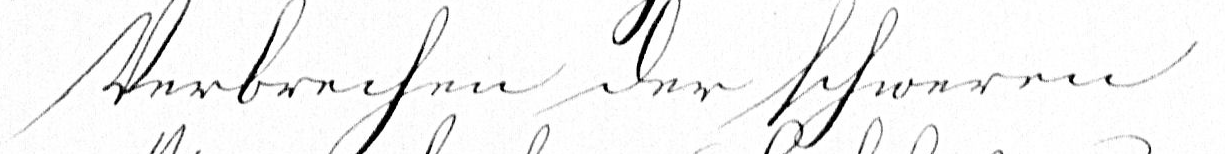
Verbrechen der schweren
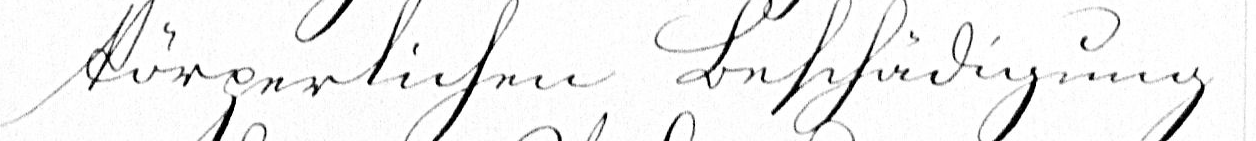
körperlichen Beschädigung
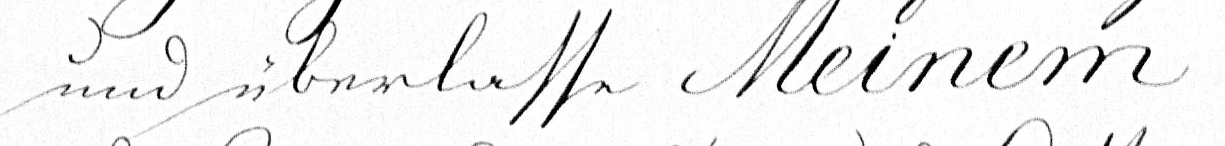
undüberlasse Meinem
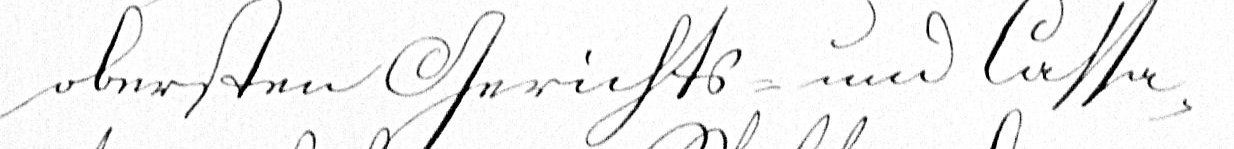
obersten Gerichts- und Cass¬
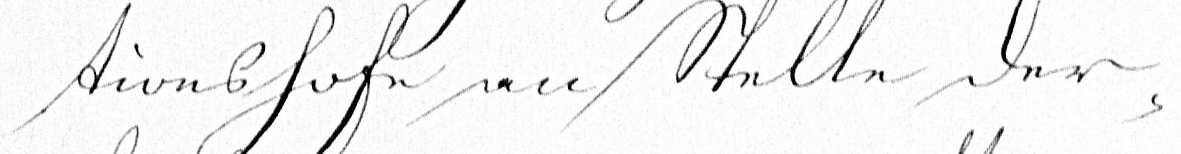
ationshofe an Stelle der¬
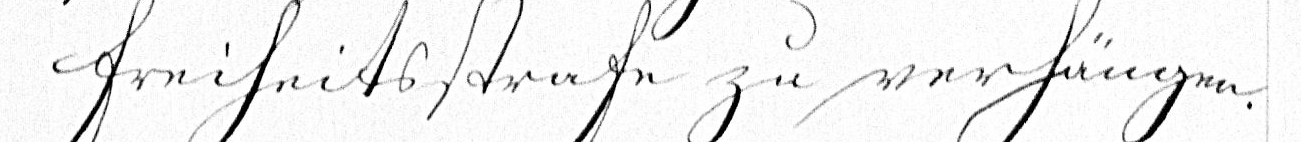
Freiheitsstrafe zu verhängen.
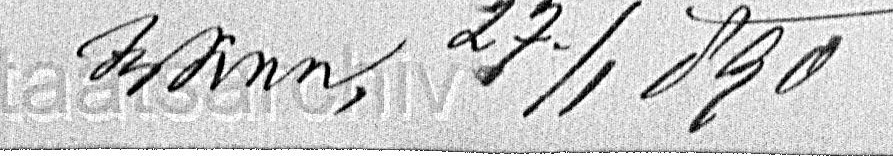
Wien, 27./1890
